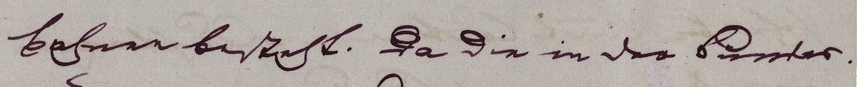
bahnen besteht. Da die in der Bundes-
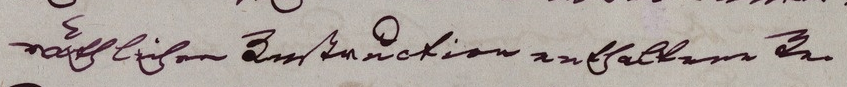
räthlichen Restruction enthaltene Re-
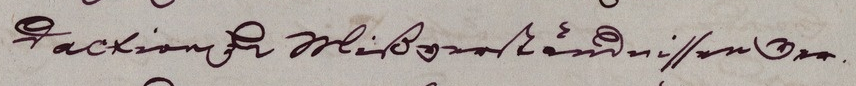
daction zu Mißverständnissen Ver-
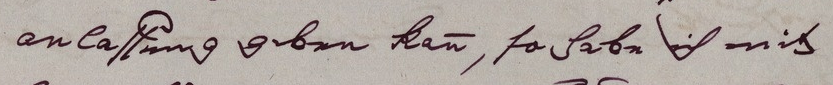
anlassung geben kann, so habe ich mit
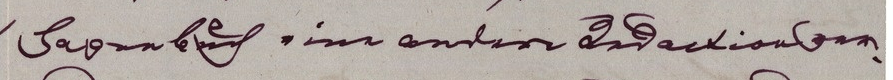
Hagenbuch eine andere Redaction ver-
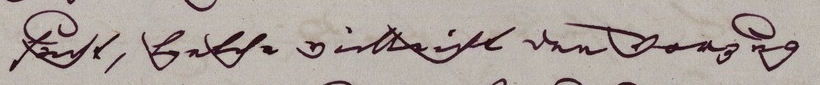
sucht, welche vielleicht den Vorzug
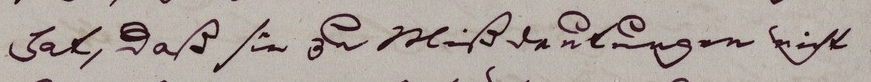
hat, daß sie zu Mißdeutungen nicht
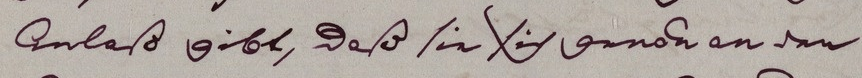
Anlaß gibt, daß sie sich genau an den
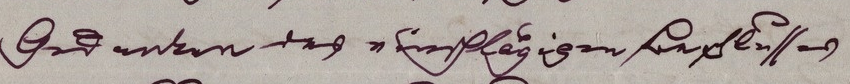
Gedanken des einschlägigen Beschlusses
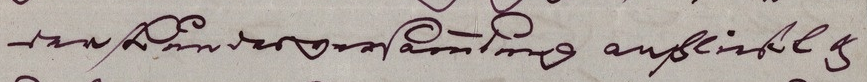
der Bundesversammlung anschließt &
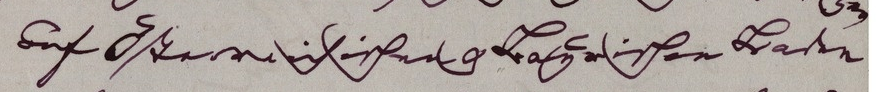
auf Österreichischen & Bayrischen Boden
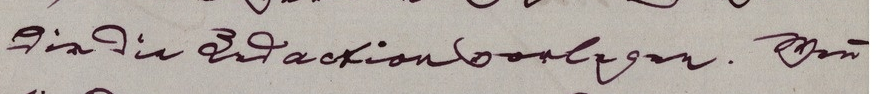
Dir die Redaction vorlegen. Wenn
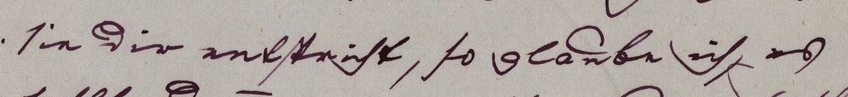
sie Dir entspricht, so glaube ich, es
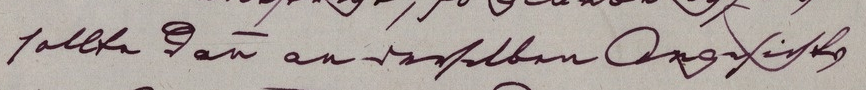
sollte dann an derselben Angesichts
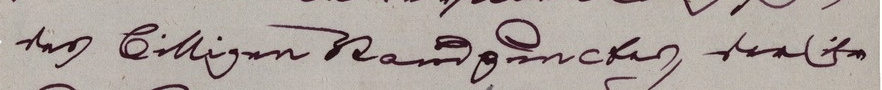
des billigen Standpunctes, der ihr
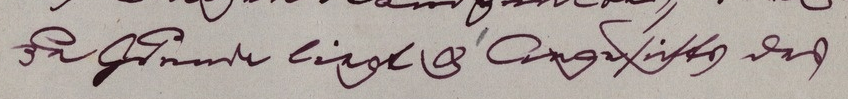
zu Grunde liegt & Angesichts des
